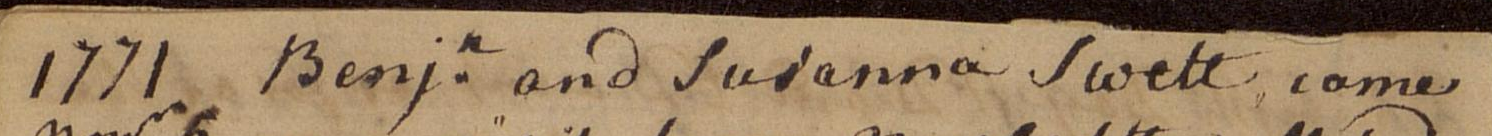1771 Benj^n. and Susanna Swett came
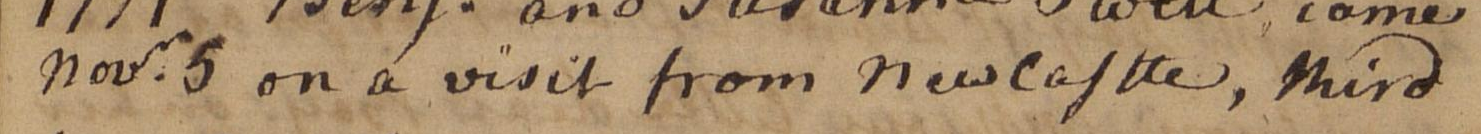Nov^r. 5 on a visit from New Castle, third
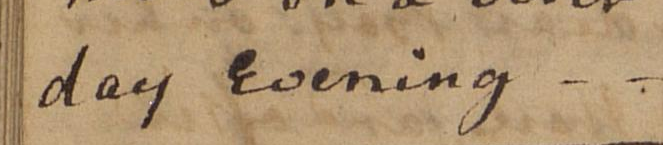day Evening-
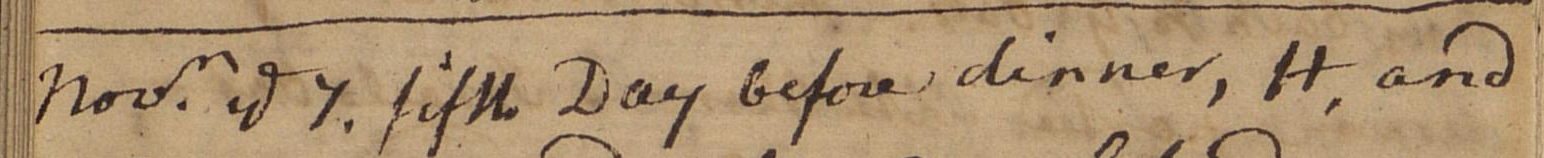Nov^r. y^e 7. fifth Day before dinner, H and
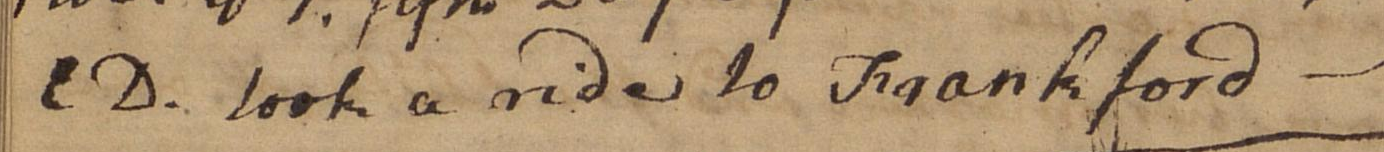ED. took a ride to Frankford-
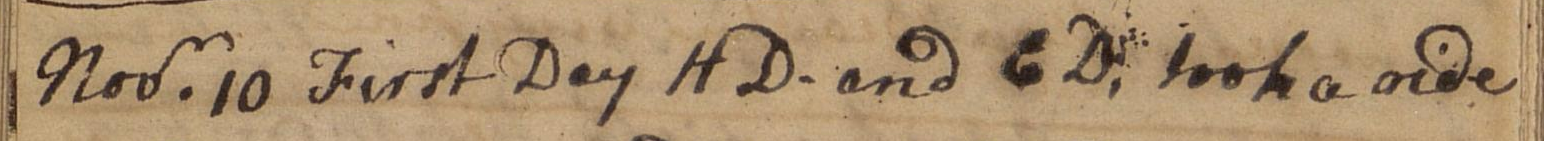Nov^m. 10 First Day HD. and ED. took a ride
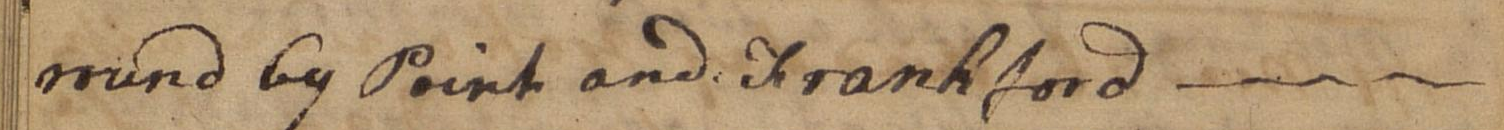round by Point and Frankford-
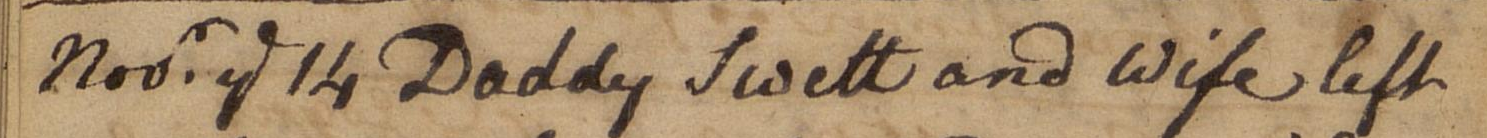Nov^r. y^e 14 Daddy Swelt and Wife left
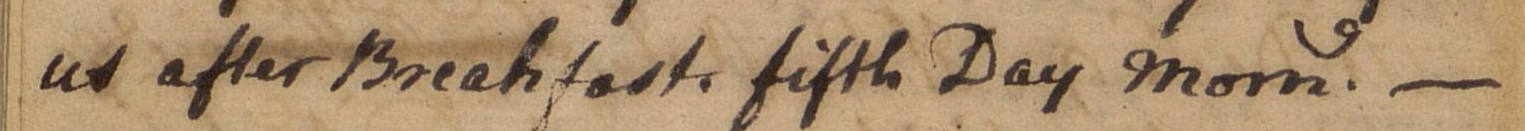us after Breakfast fifth Day Morn^g.-
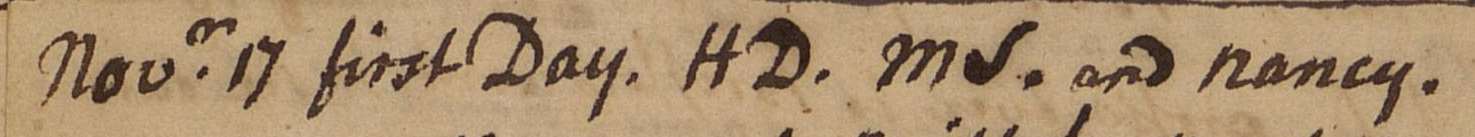Nov^r. 17 first Day. HD^. MS. and Nancy.
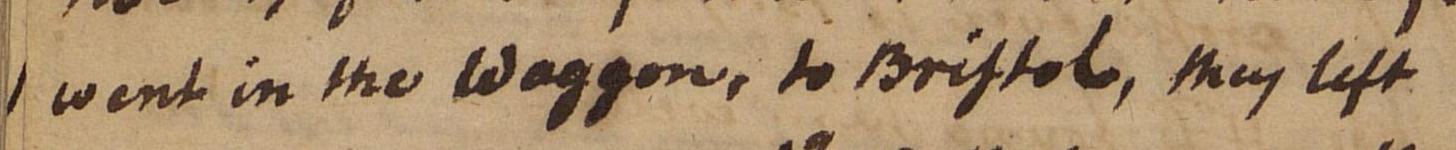went in the Waggon, to Bristol, they left
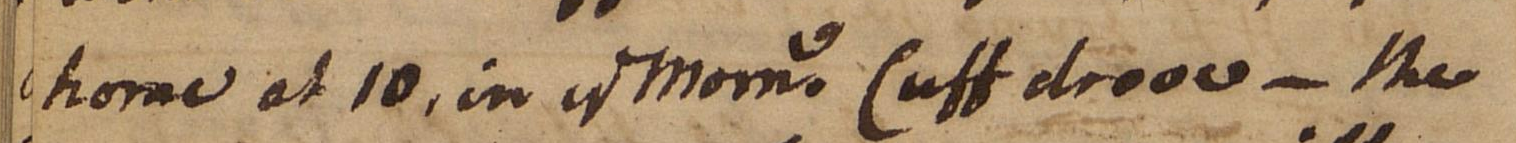home at 10, in y^e Morn^g. Cuff drove- the
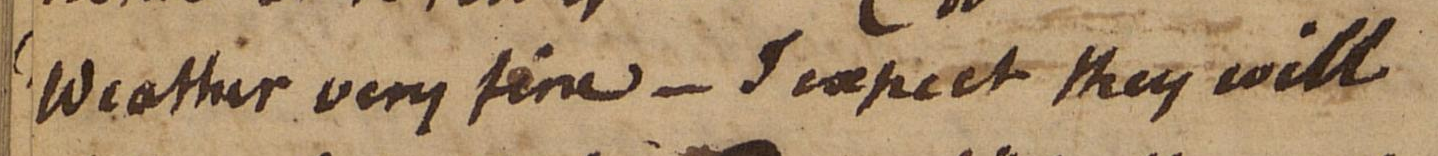Weather very fine- I expect they will
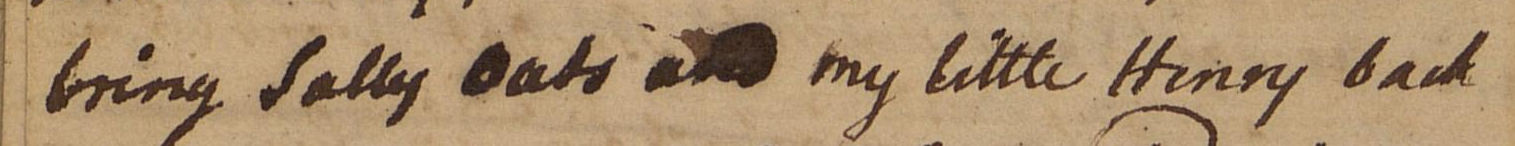bring Sally Oats and my little Henry back
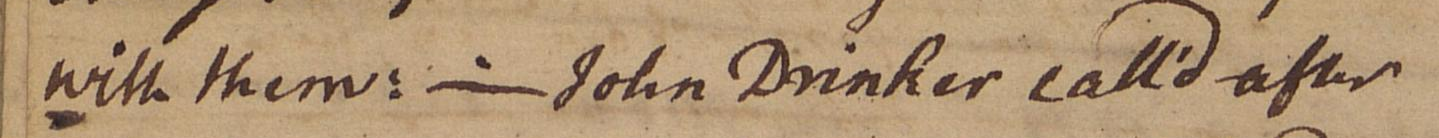with them:- John Drinker call'd after
